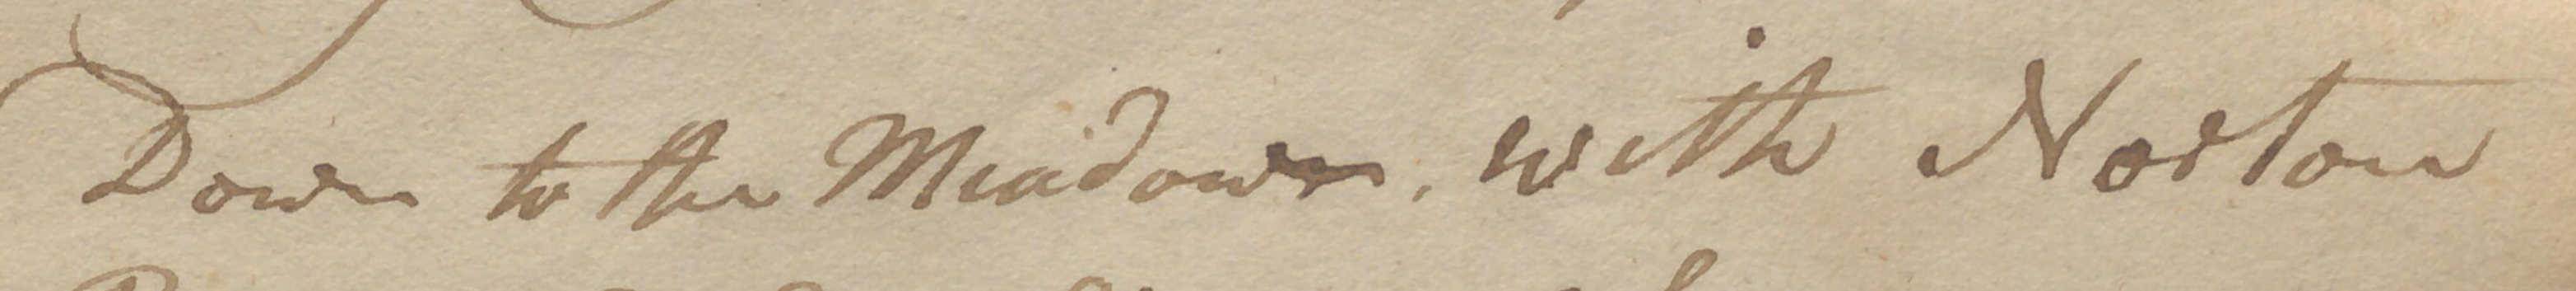Dowr to the Meadows with Norton
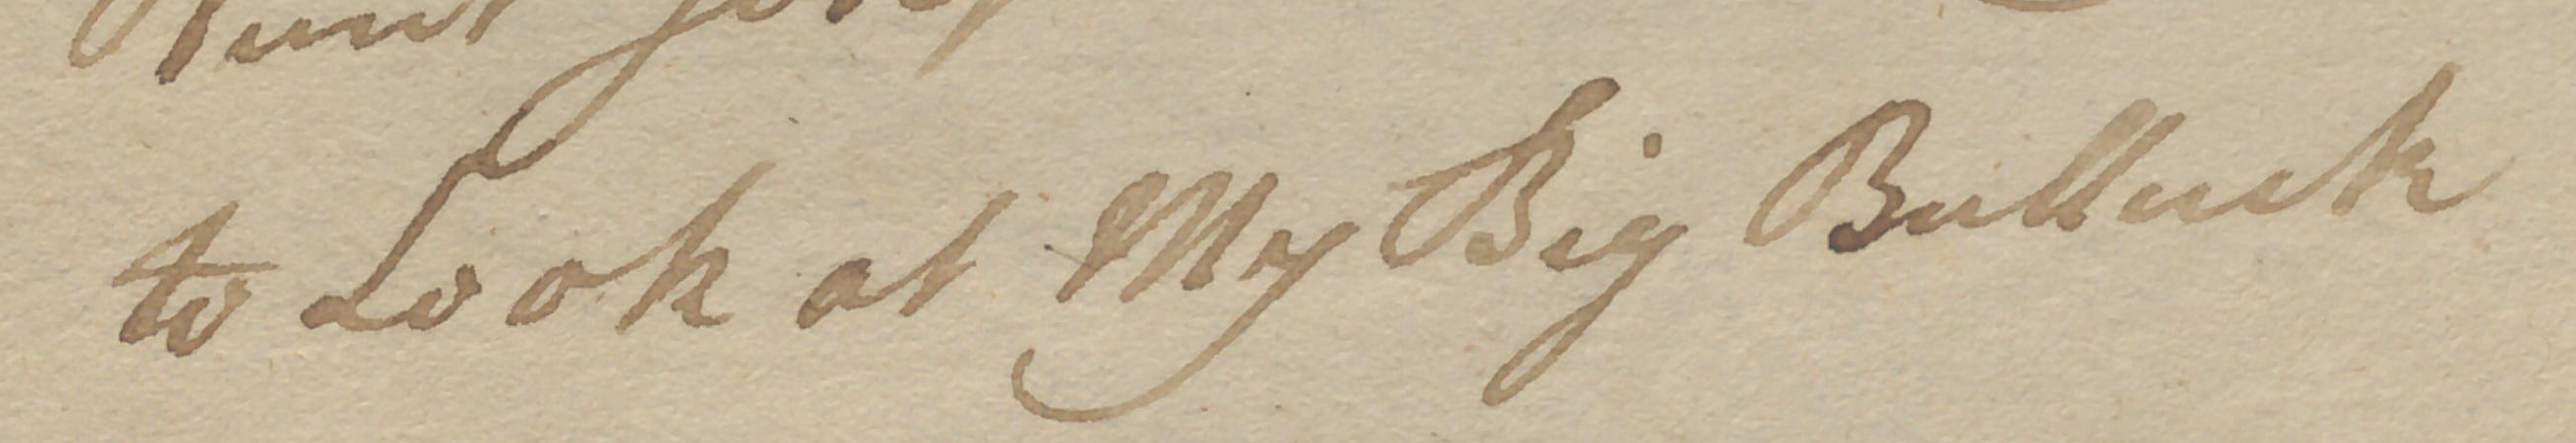to Look at My Big Bulluck
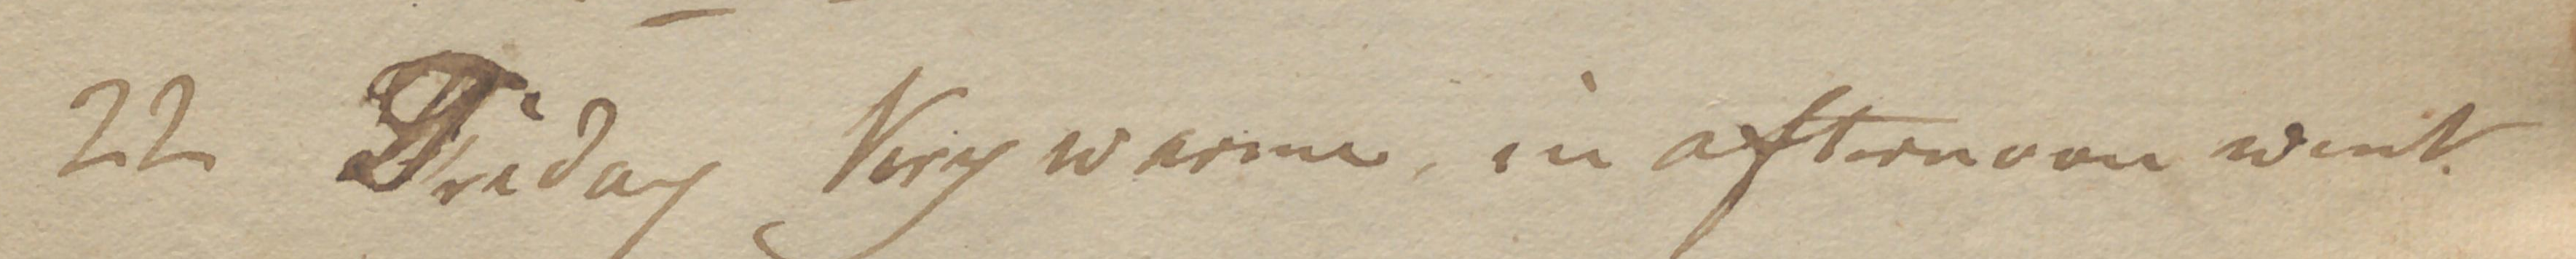22. Friday Very warme, in afternoon went
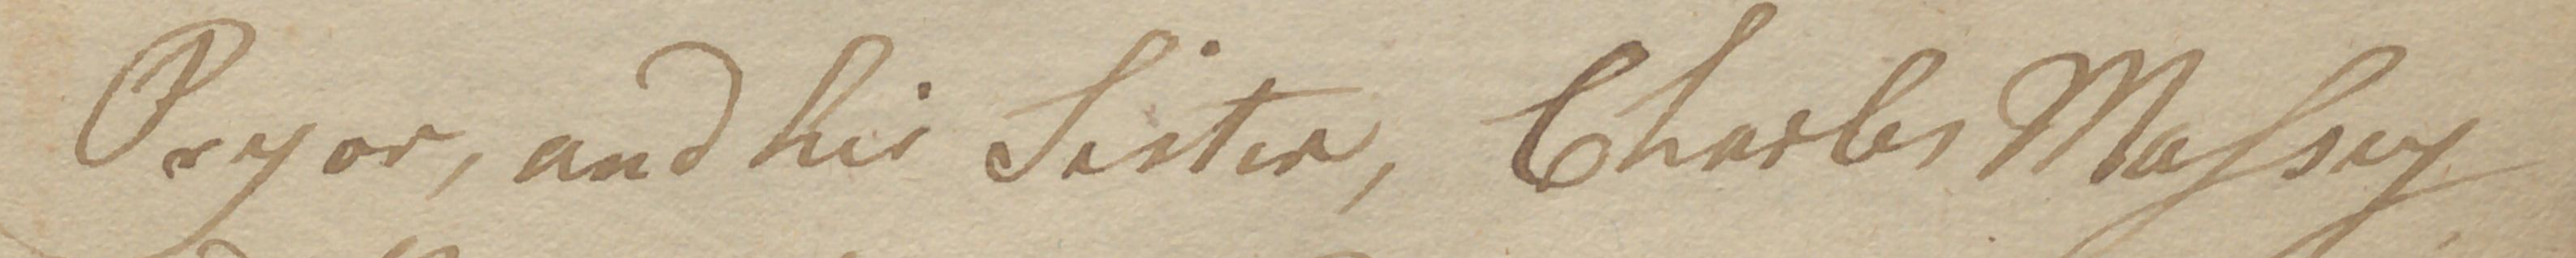Pryor, and his Sister, Charles Massey
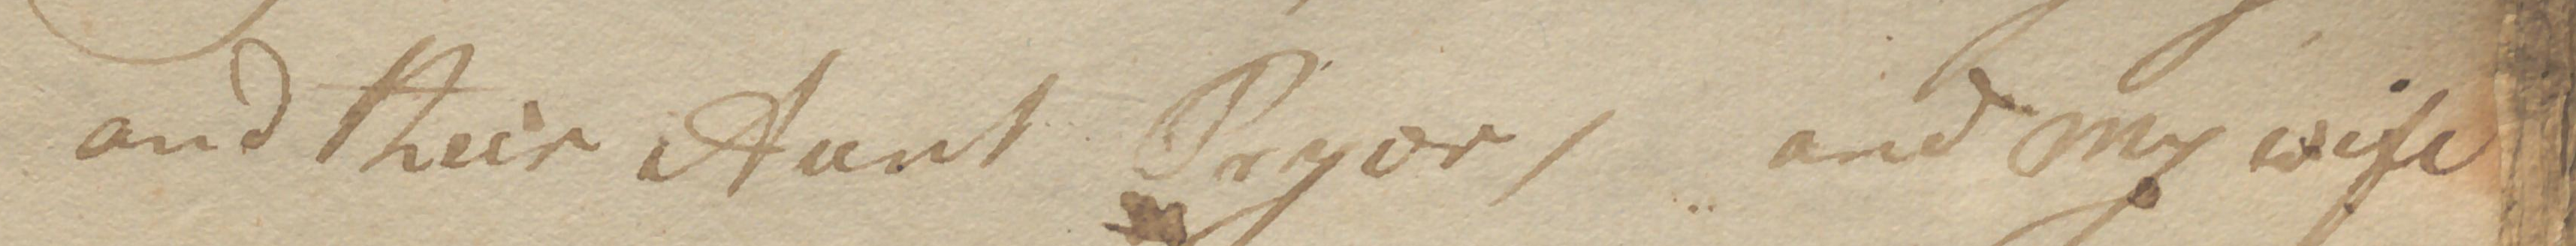and their Aunt Pryor, and my wife
